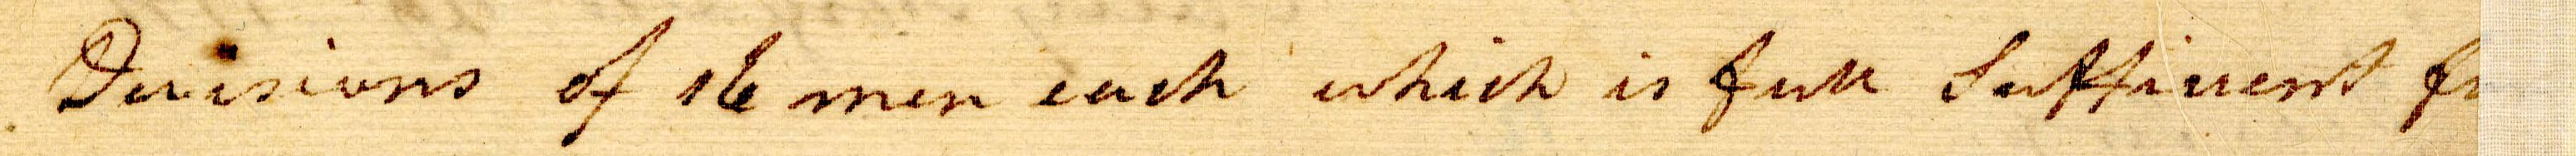Divisions of 16 men each which is full Sufficient for
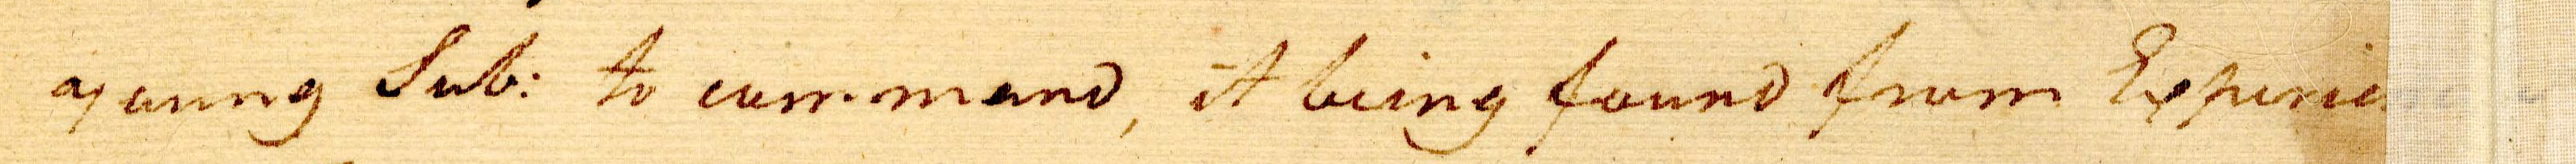young Sub: to command, it being found from Experience
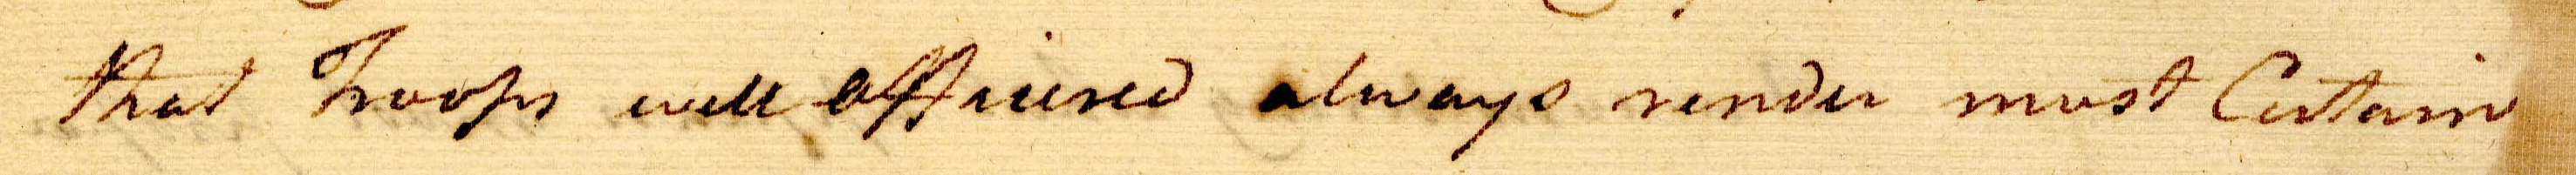that Troops well oficcered always render most Certain
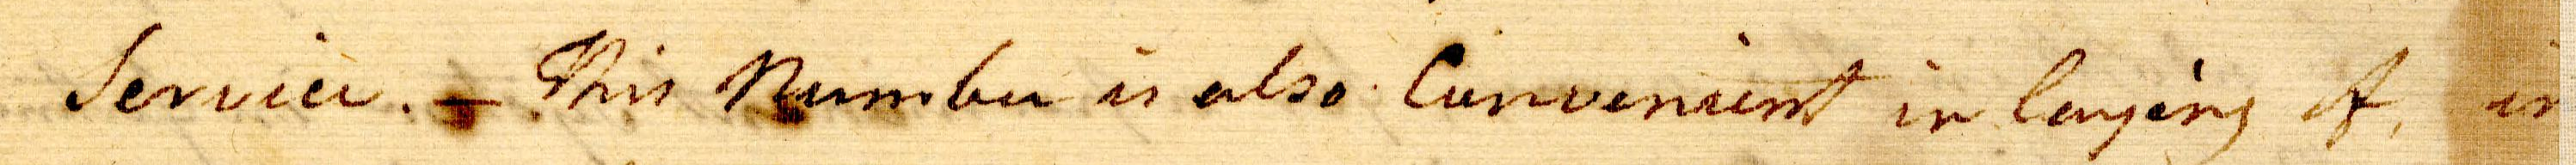Serivce.- This Number is also Convenient in laying of, in
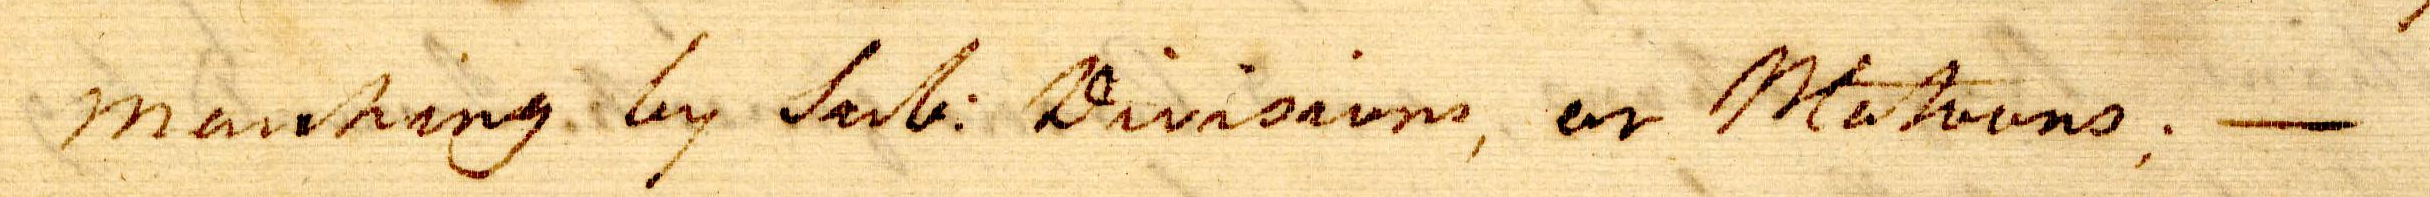marching by Sub: Divisions, or Platoons;-
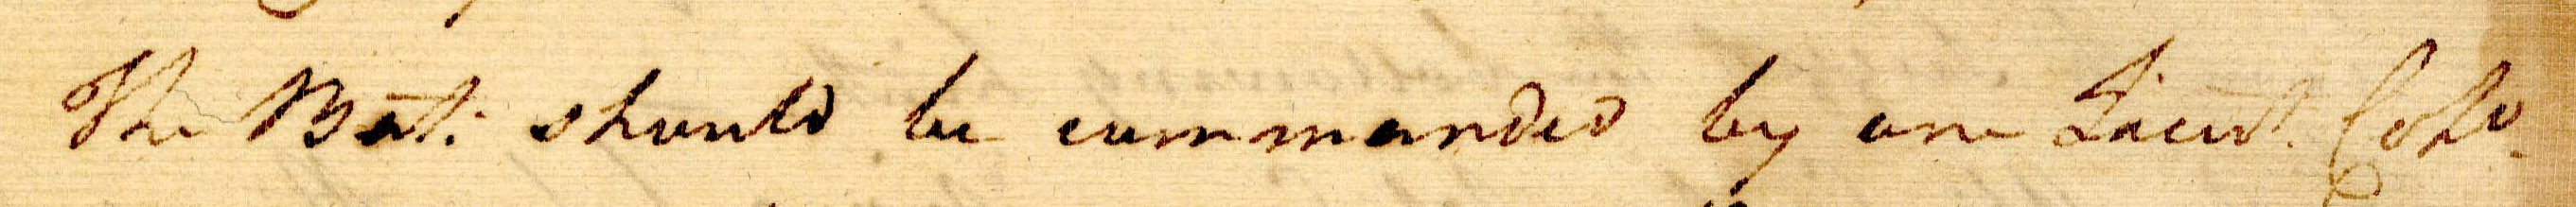The Bat: should be commanded by one Lieu^t. Col^o.
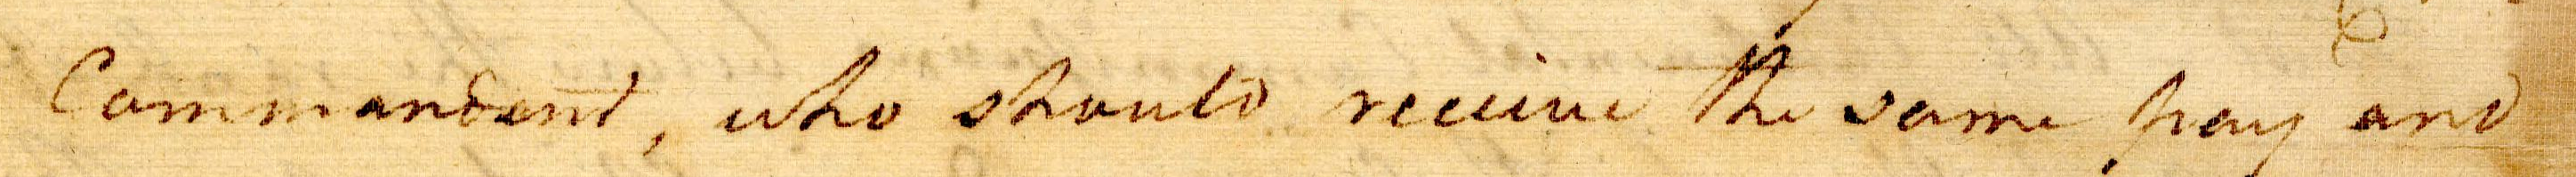Commandant, who should receive the same pay and
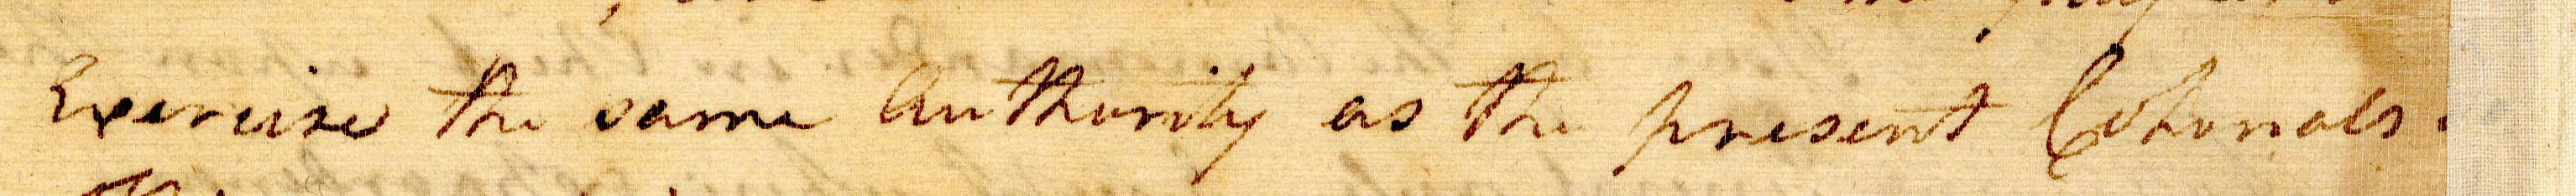Exercise the same Authority as the present Colonels do.
